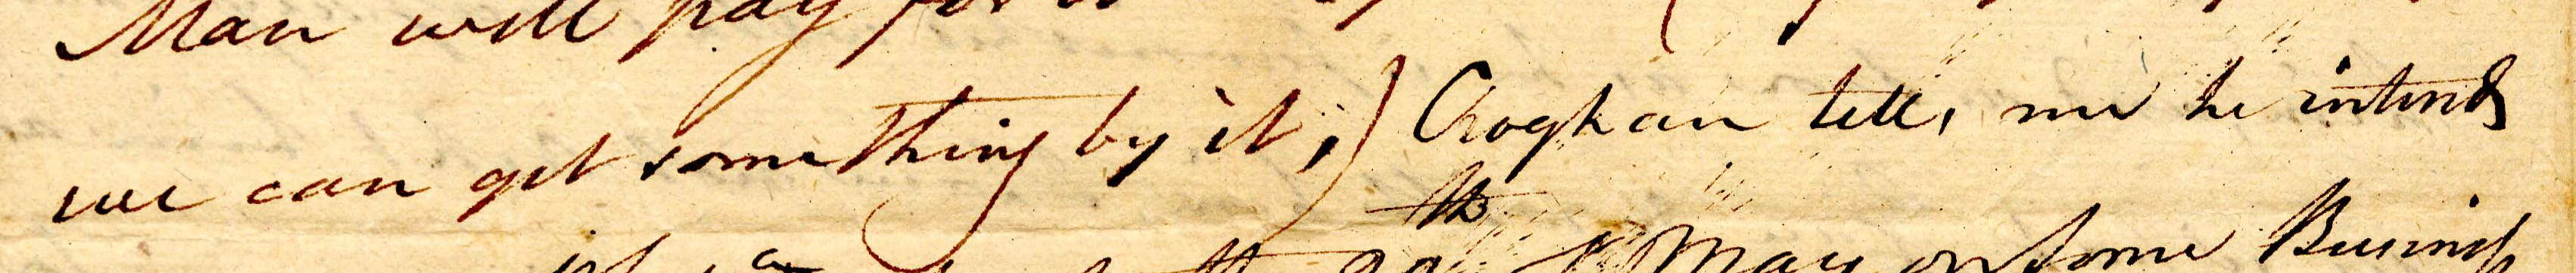we can get some thing by it) Croghan tells me he intends
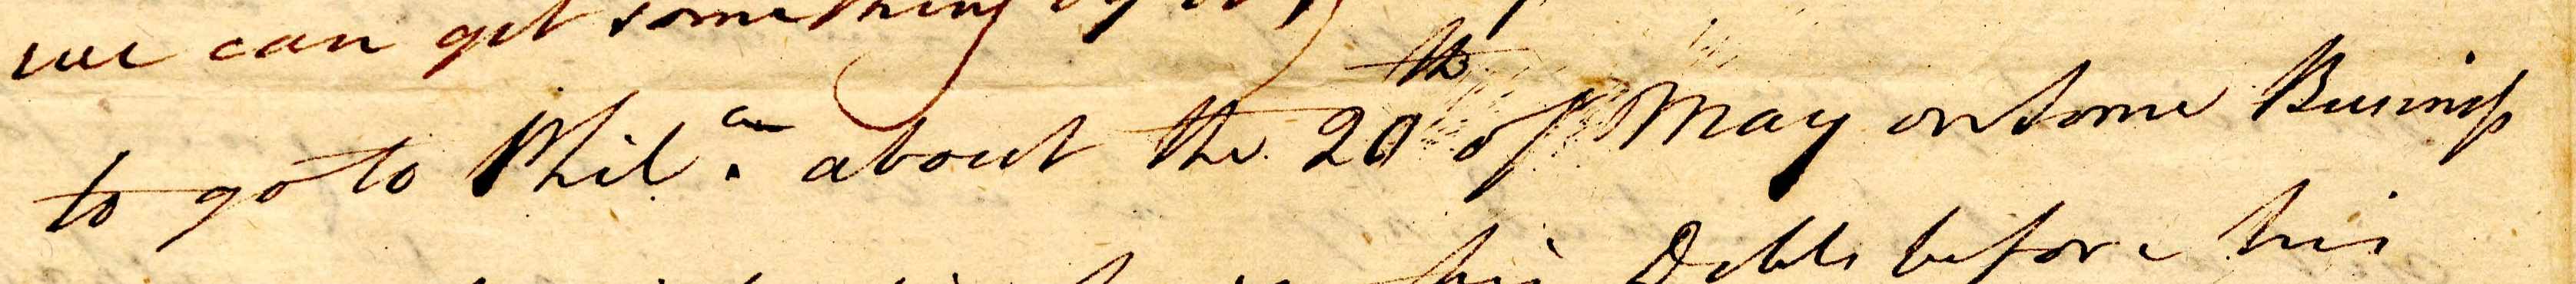to go to Phil^a about the 20^th of May on some Business
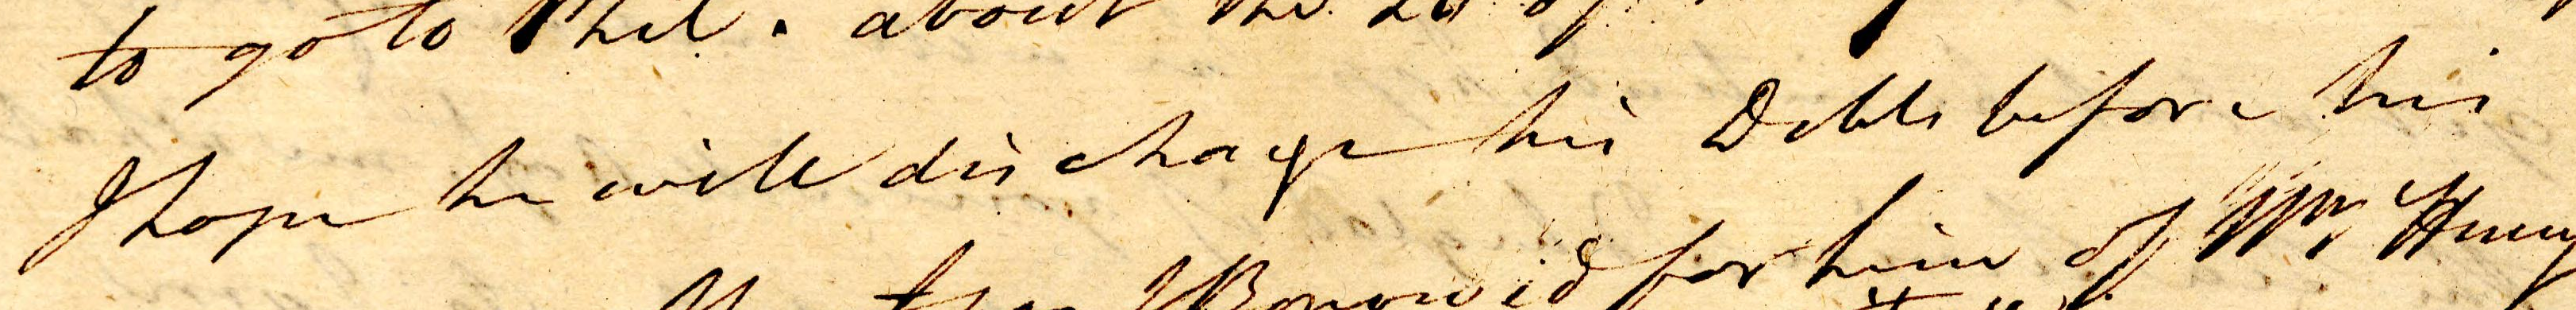I hope he will discharge his Debts before his
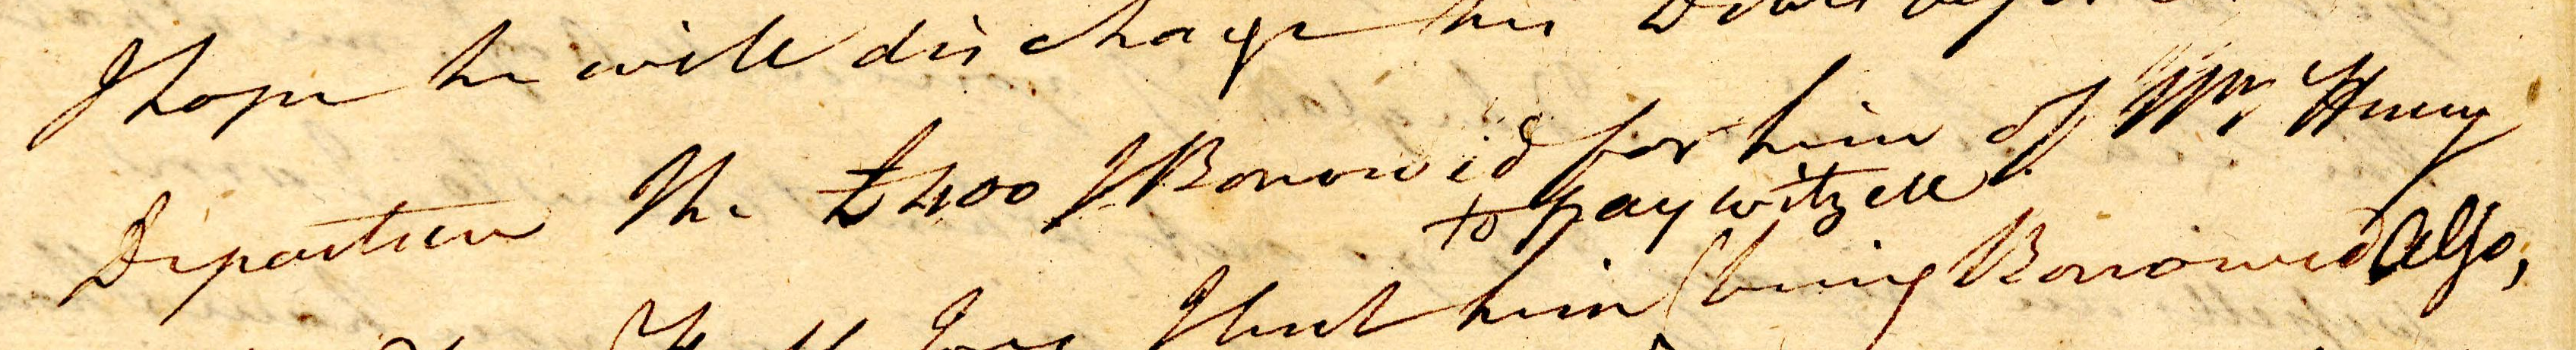departure the £400 I Borrowed for him of W^m. Henry
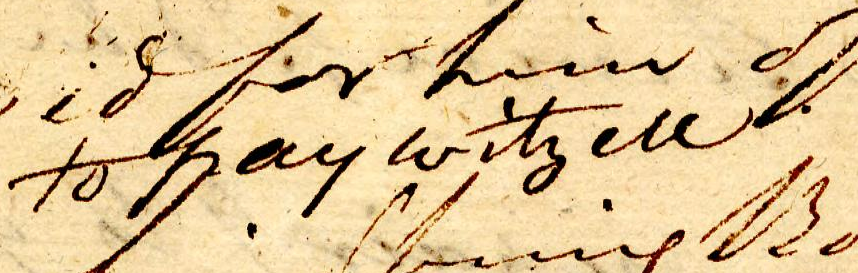to pay witz M
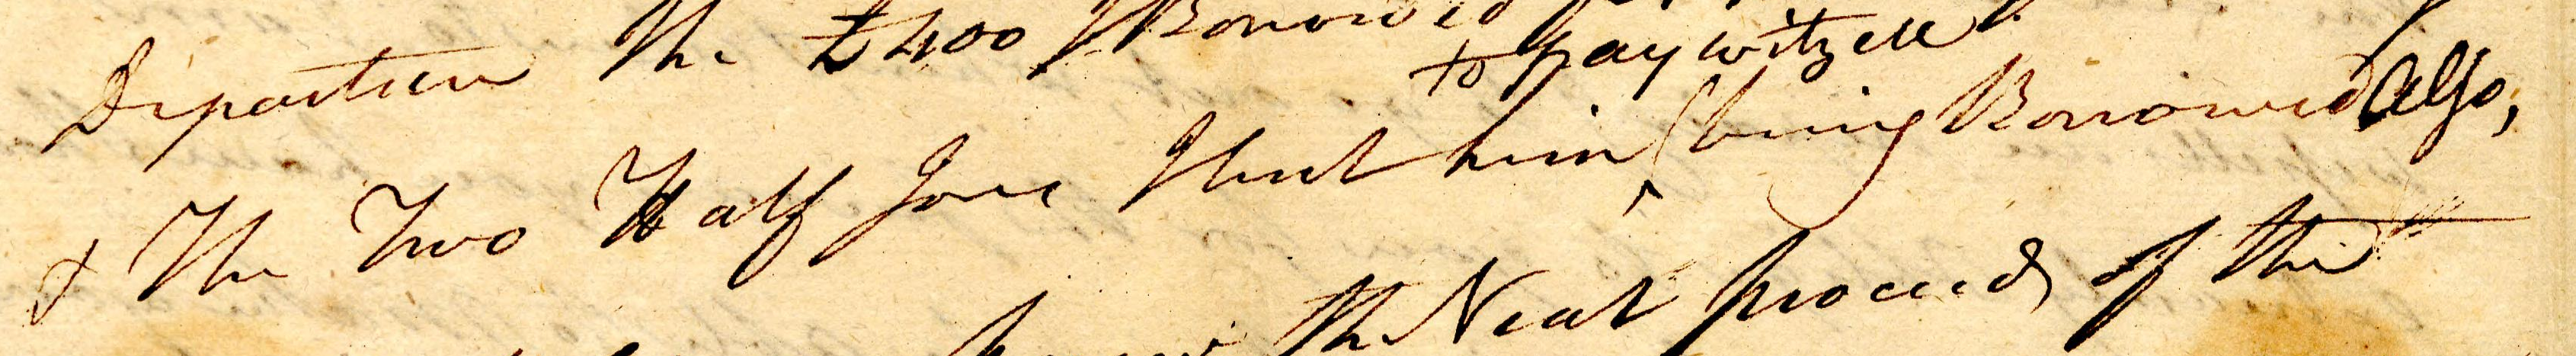& the Two half for think him ^ being Borrowed Also,
